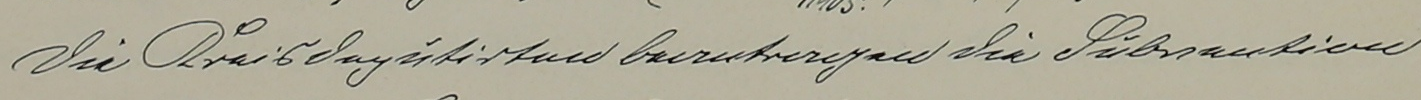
Die Kreisdeputirten beantragen die Subvention
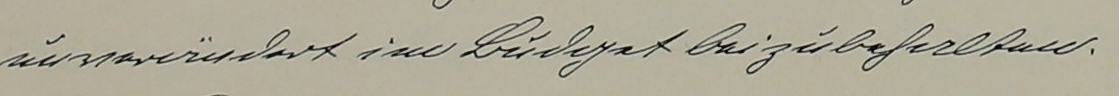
unverändert im Budget beizubehalten.
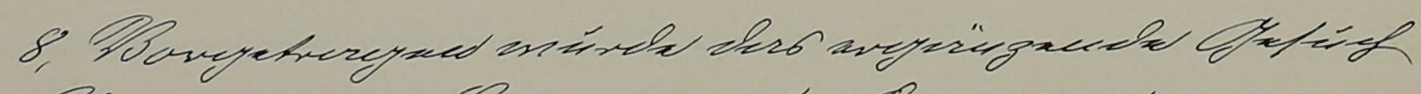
8. Vorgetragen wurde das ergänzende Gesuch
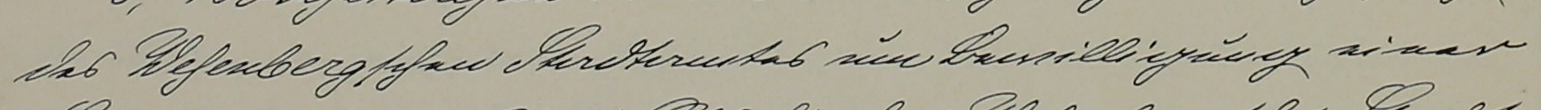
des Wesenbergschen Stadtamtes um Bewilligung einer
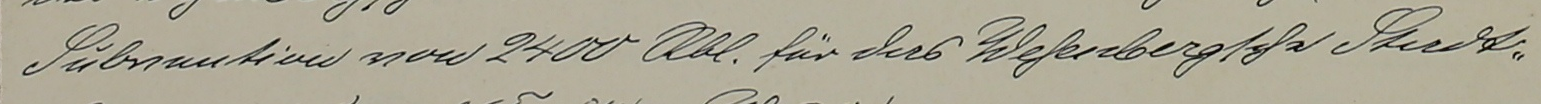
Subvention von 2400 Rbl. für das Wesenbergsche Stadt-
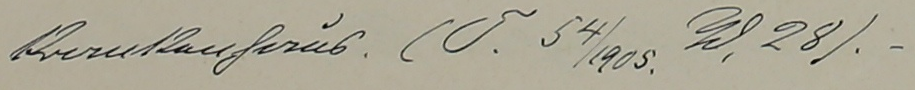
krankenhaus (T.54/1905. W.28).
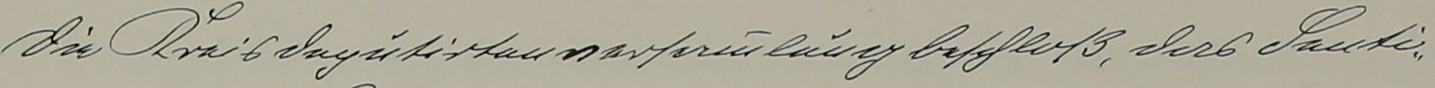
Die Kreisdeputirtenversammlung beschloß, das Senti-
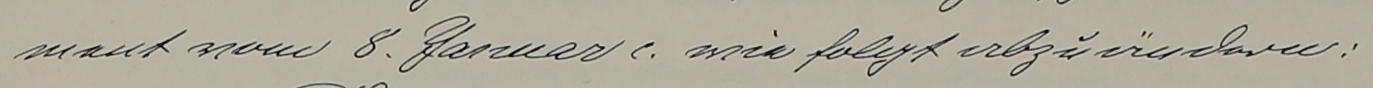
ment vom 8. Januar c. wie folgt abzuändern:
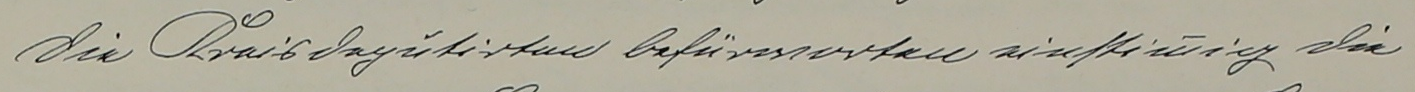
Die Kreisdeputirten befürworten einstimmig die
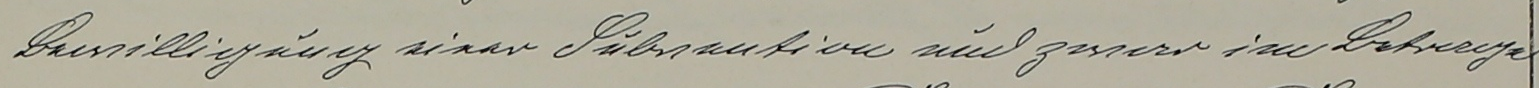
Bewilligung einer Subvention und zwar im Betrage
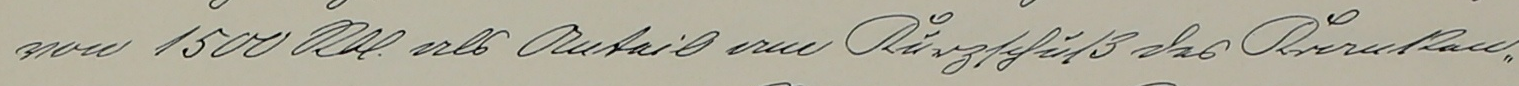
von 1500 Rbl. als Anteil am Kurzschuß des Kranken-
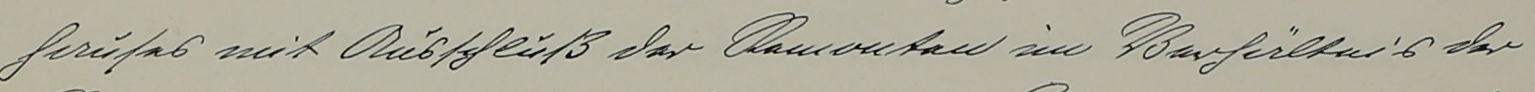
hauses mit Ausschluß der Remonten im Verhältnis der
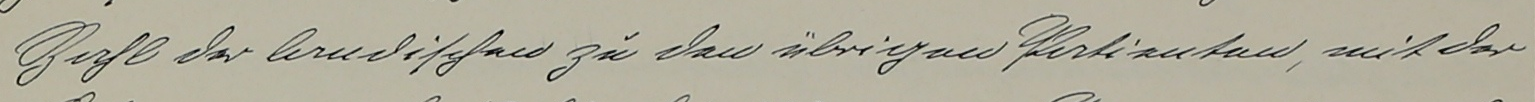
Zahl der landischen zu den übrigen Patienten, mit der
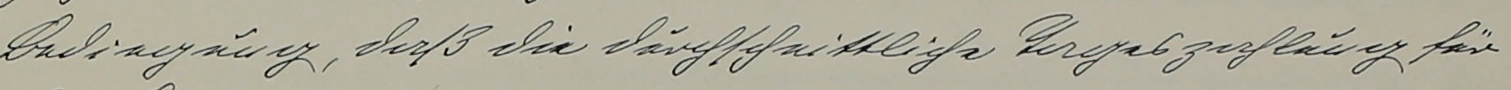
Bedingung, daß die durchschnittliche Tageszahlung für
